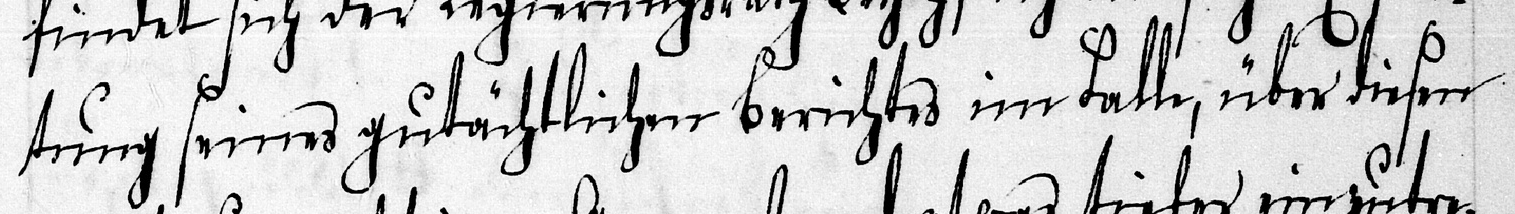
tung seines gutächtlichen Berichtes im Falle, über diesen
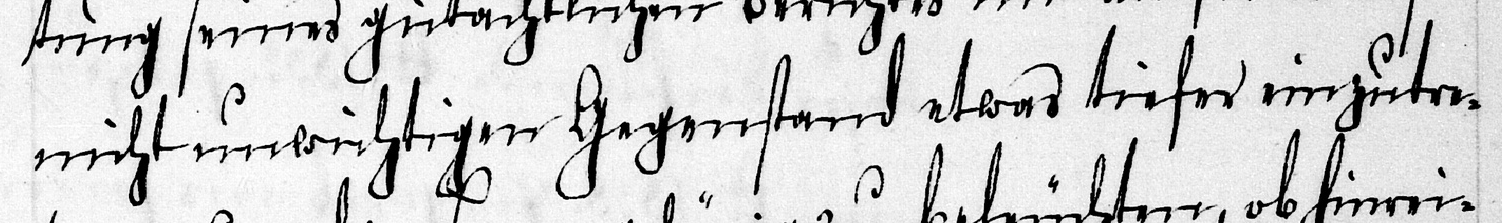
nicht unwichtigen Gegenstand etwas tiefer einzutre¬
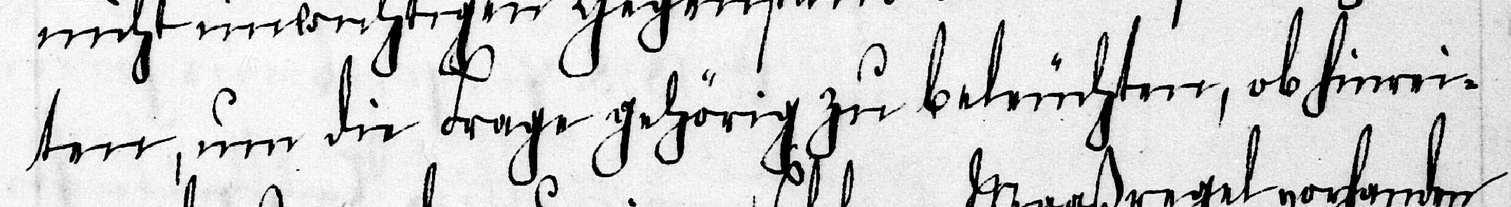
ten, um die Frage gehörig zu beleuchten, ob hinrei¬
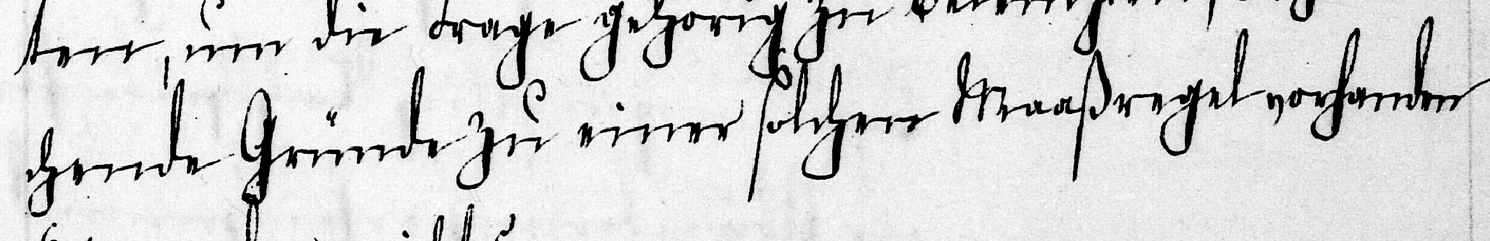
chende Gründe zu einer solchen Maaßregel vorhanden
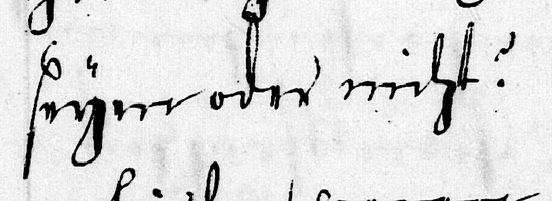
seyen oder nicht?
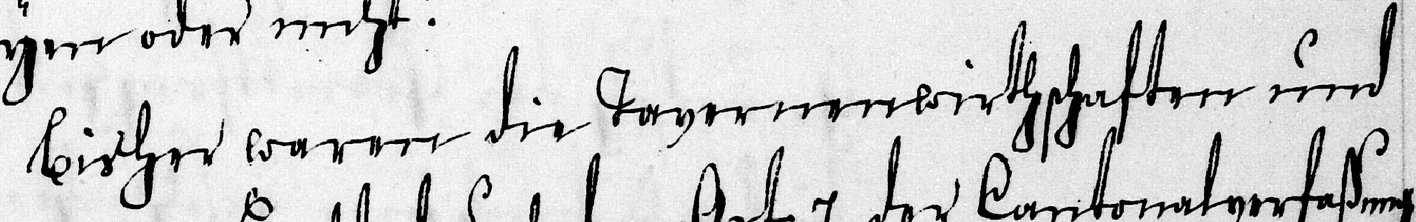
Bisher waren die Tavernenwirthschaften und
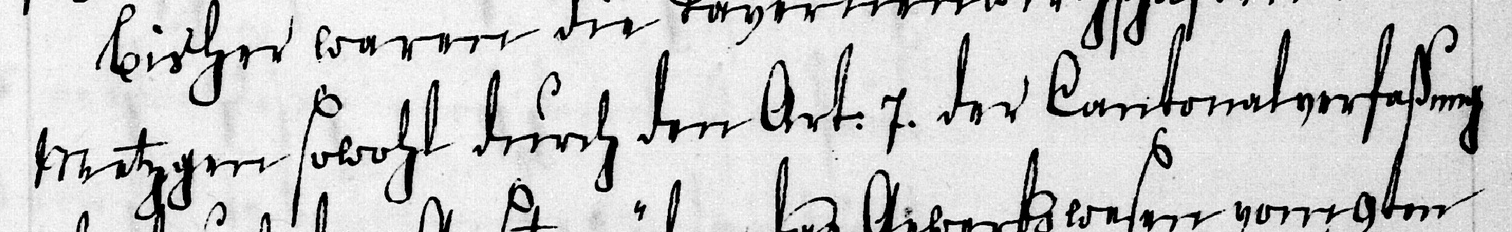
Metzgen sowohl durch den Art: 7. der Cantonalverfaßung
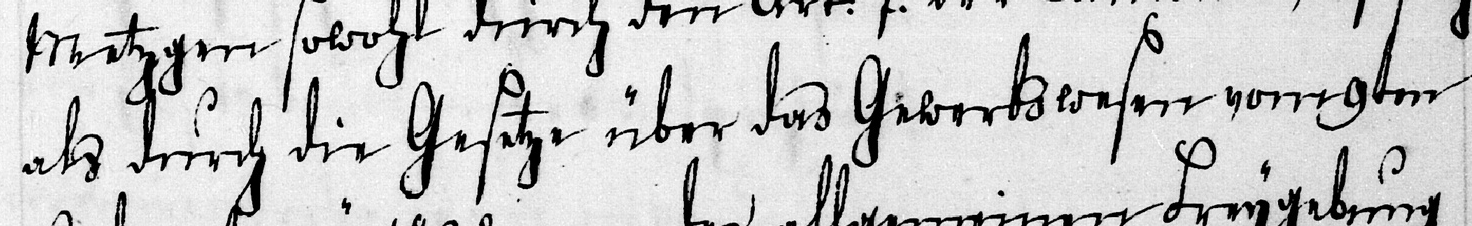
als durch die Gesetze über das Gewerbswesen vom 9ten
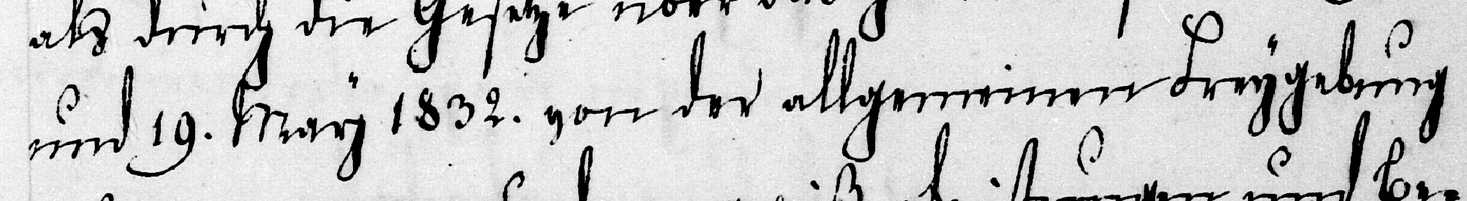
und 19. März 1832. von der allgemeinen Freygebung
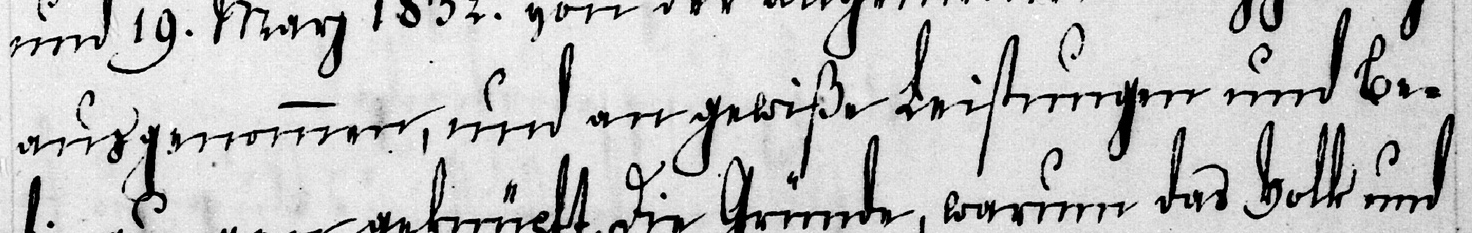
ausgenommen, und an gewiße Leistungen und Be¬
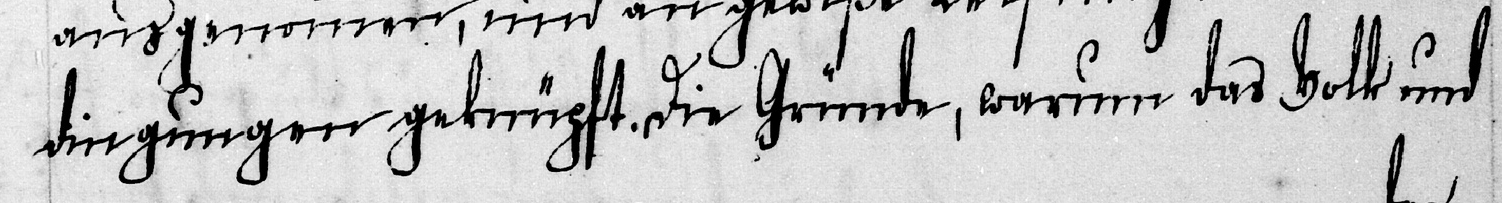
dingungen geknüpft. Die Gründe, warum das Volk und
